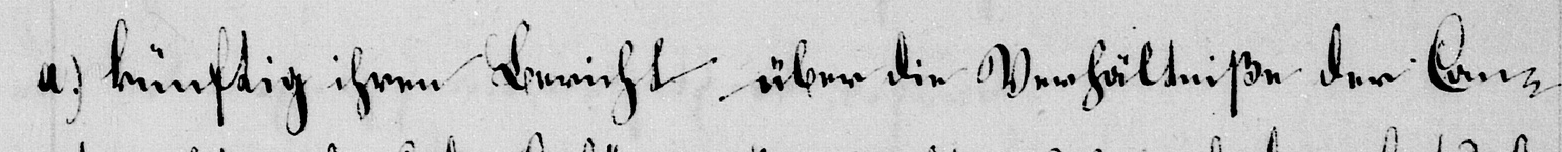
a.) künftig ihren Bericht über die Verhältniße der Can¬
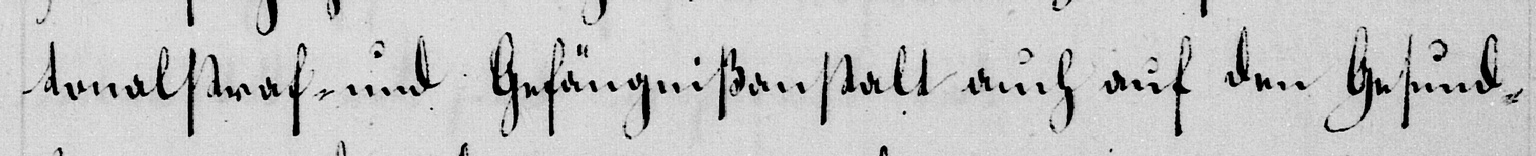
tonalstraf- und Gefängnißanstalt auch auf den Gesund¬
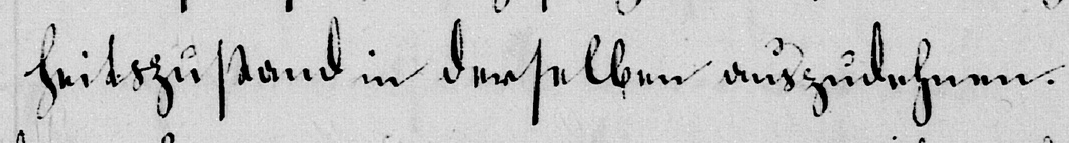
heitszustand in derselben auszudehnen.
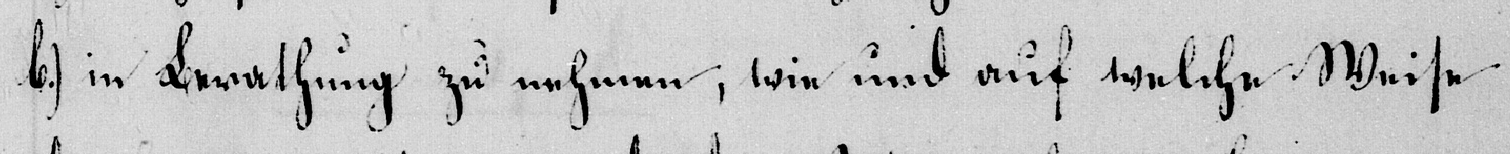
b.) in Berathung zu nehmen, wie und auf welche Weise
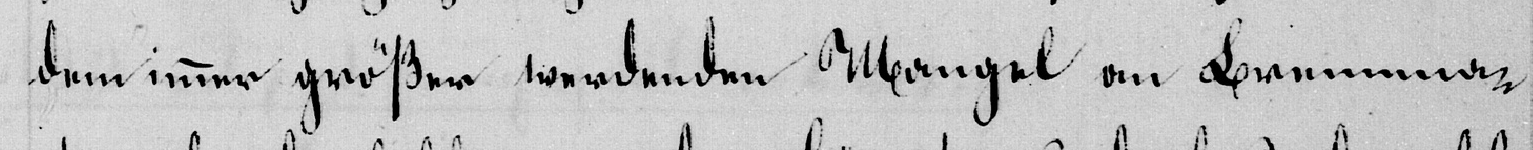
dem immer größer werdenden Mangel an Brennma¬
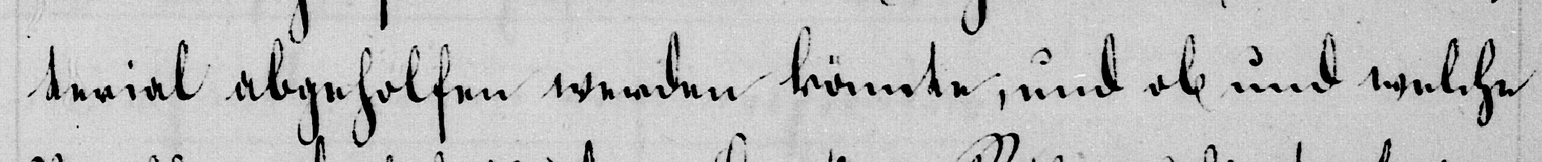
terial abgeholfen werden könnte, und ob und welche
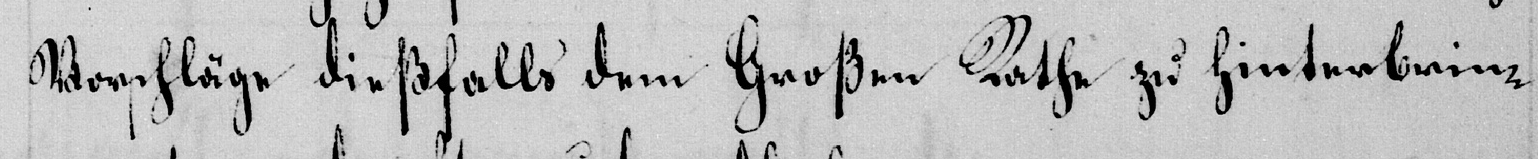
Vorschläge dießfalls dem Großen Rathe zu hinterbrin¬
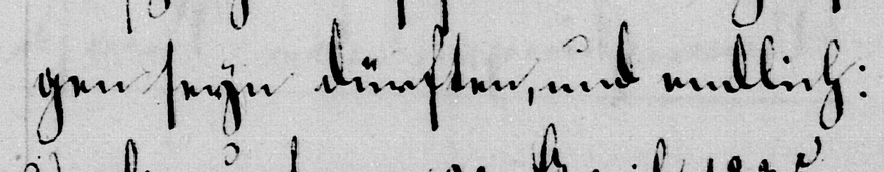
gen seyn dürften, und endlich:
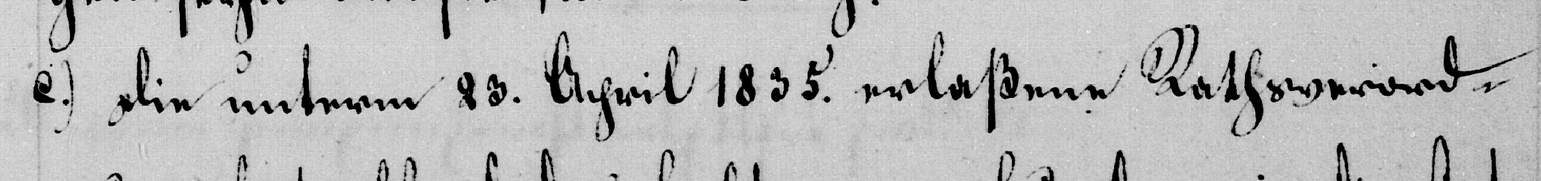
c.) die unterm 23. April 1835. erlaßene Rathsverord¬
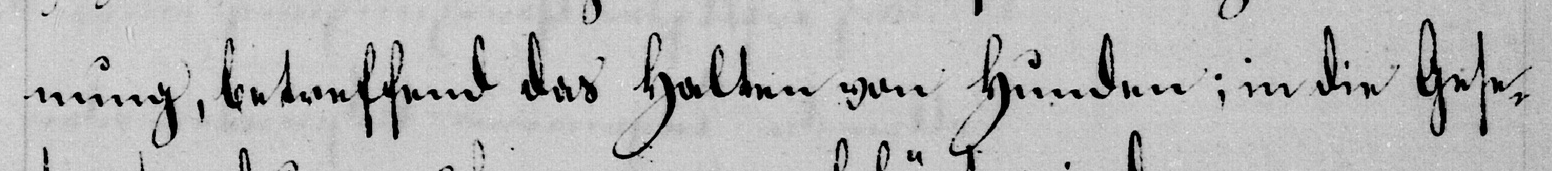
nung, betreffend das Halten von Hunden; in die Gese¬
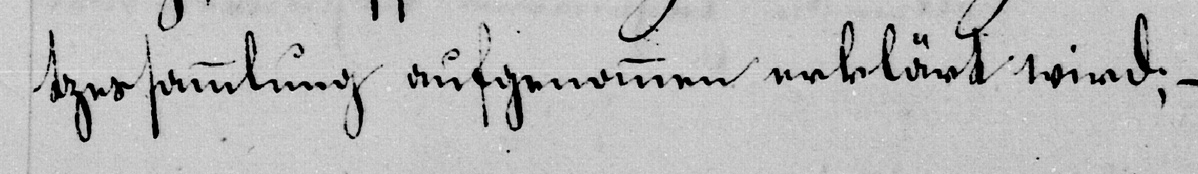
tzessammlung aufgenommen erklärt wird,
